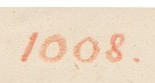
Darmstadt
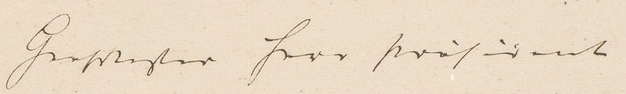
Geehrtester Herr Präsident
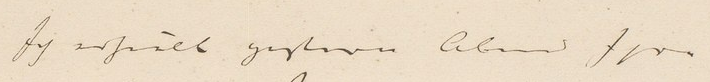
Ich erhielt gestern Abend Ihre
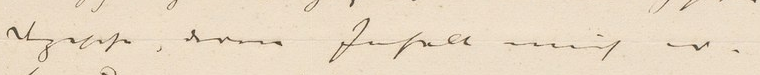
Depesche, deren Inhalt mich er-
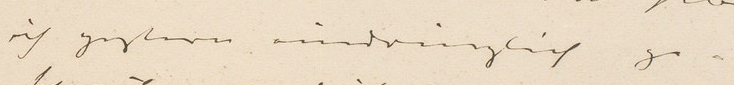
ich gestern eindringlich ge-
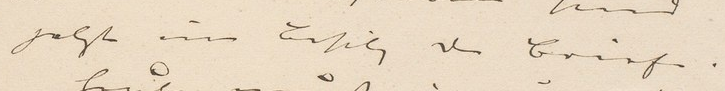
jetzt im Besitz der Briefe.
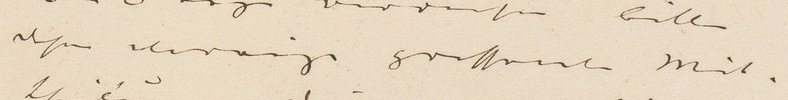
daher etwaige pressante Mit-
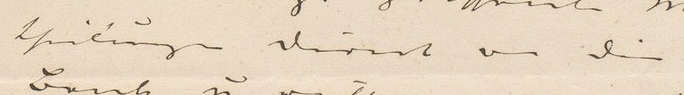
theilungen direct an die
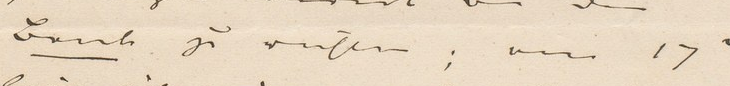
Bank zu richten; am 17t
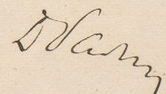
Dr Parcus
